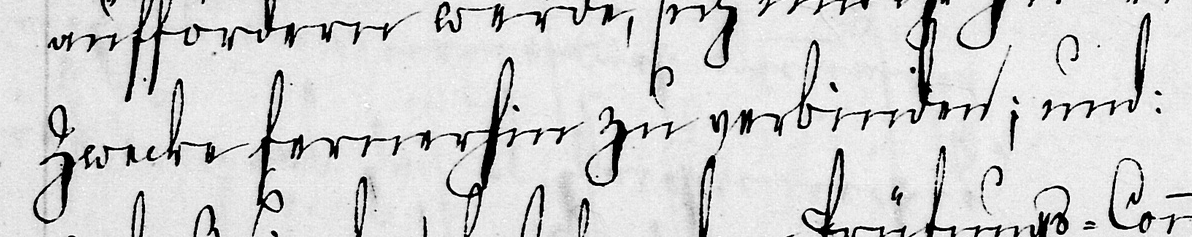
Zwecke fernerhin zu verbinden; und:
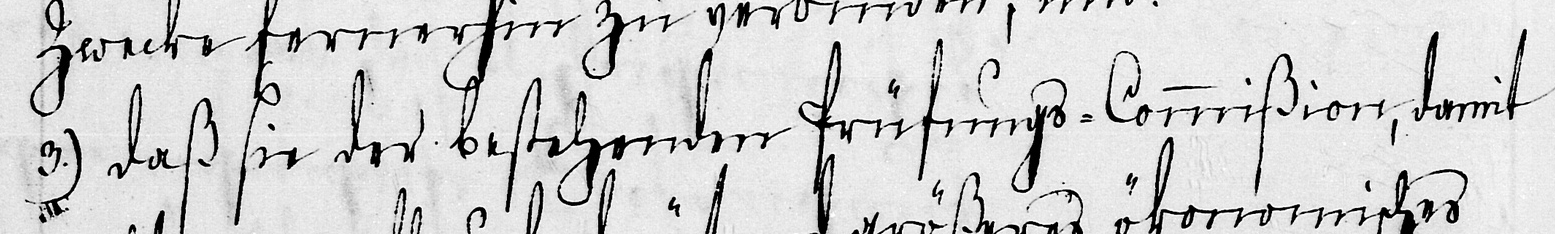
3.) daß sie der bestehenden Prüfungs-Commißion, damit
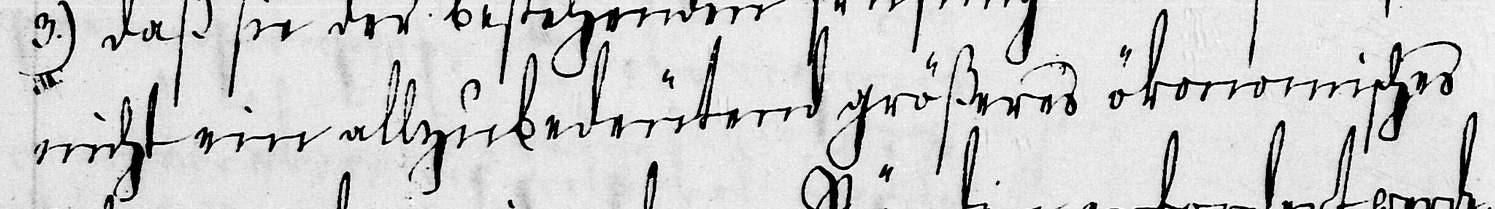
nicht ein allzubedeutend größeres ökonomisches
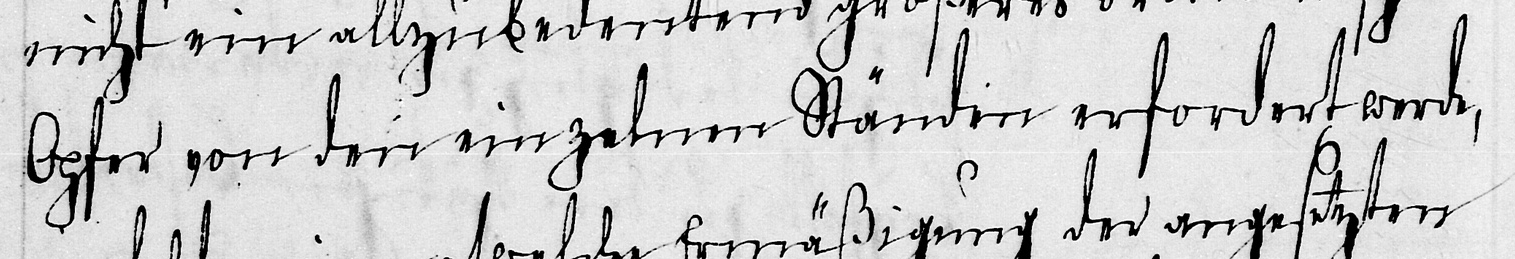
Opfer von den einzelnen Ständen erfordert werde,
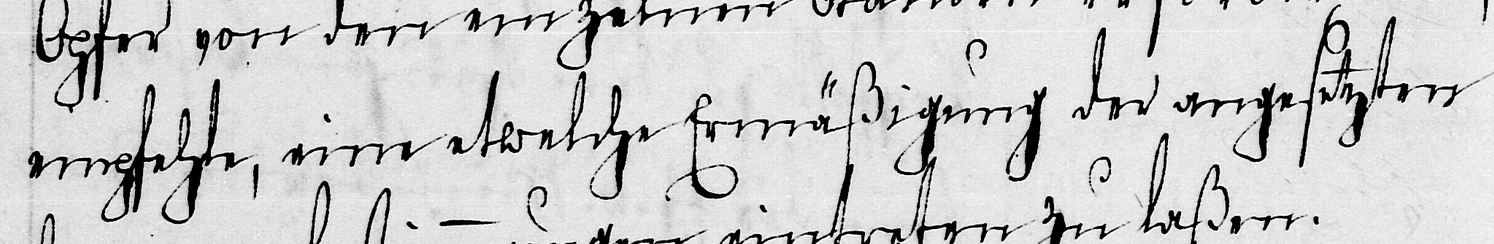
empfehle, eine etwelche Ermäßigung der angesetzten
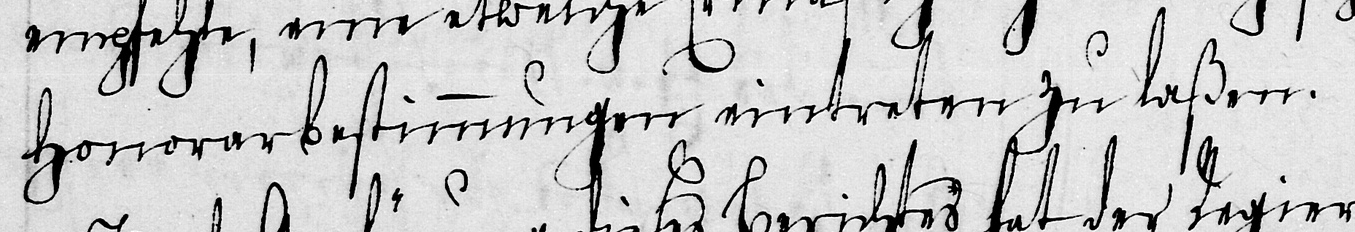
Honorarbestimmungen eintreten zu laßen.
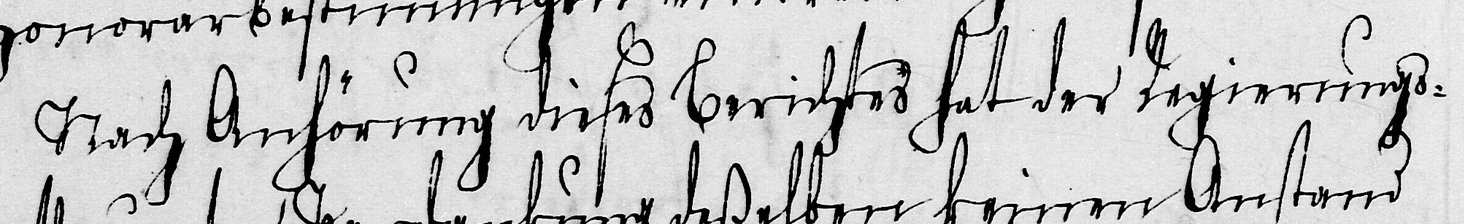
Nach Anhörung dieses Berichtes hat der Regierungs¬
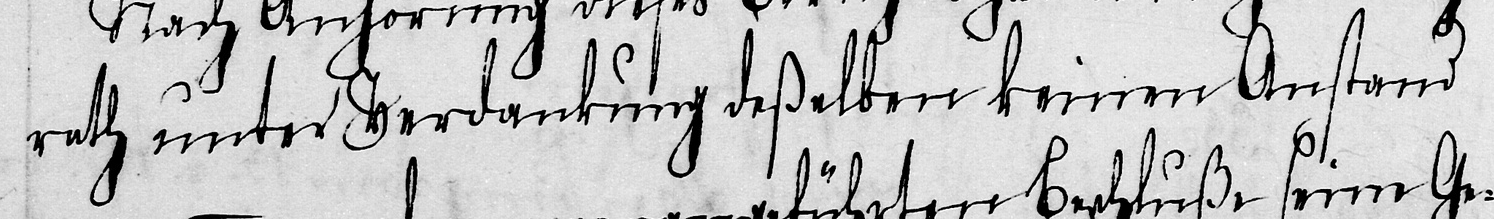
rath unter Verdankung deßelben keinen Anstand
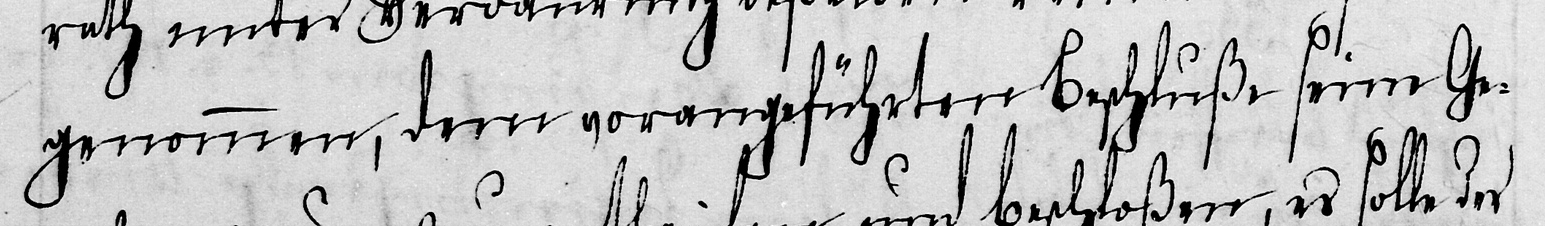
genommen, dem vorangeführten Beschluße seine Ge¬
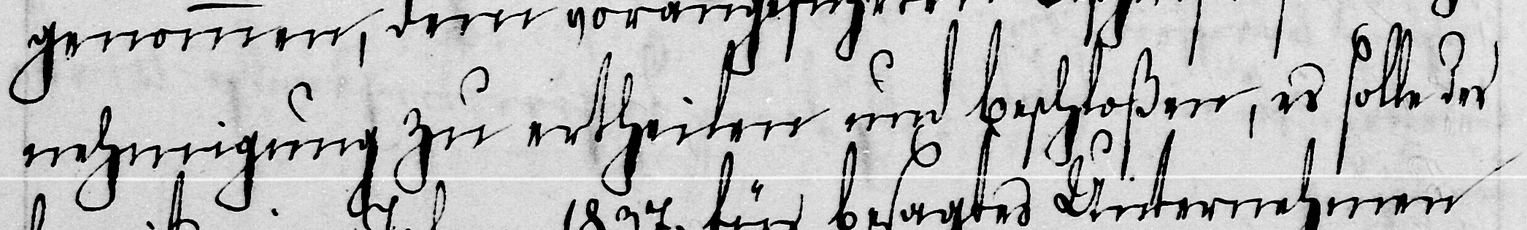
nehmigung zu ertheilen und beschloßen, es solle
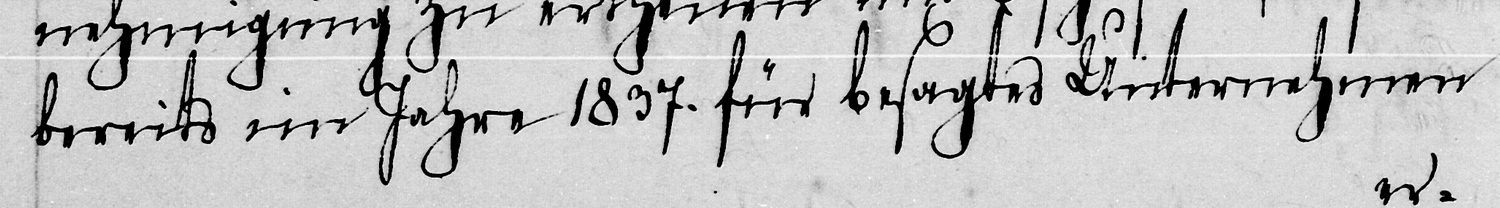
bereits im Jahre 1837. für besagtes Unternehmen
